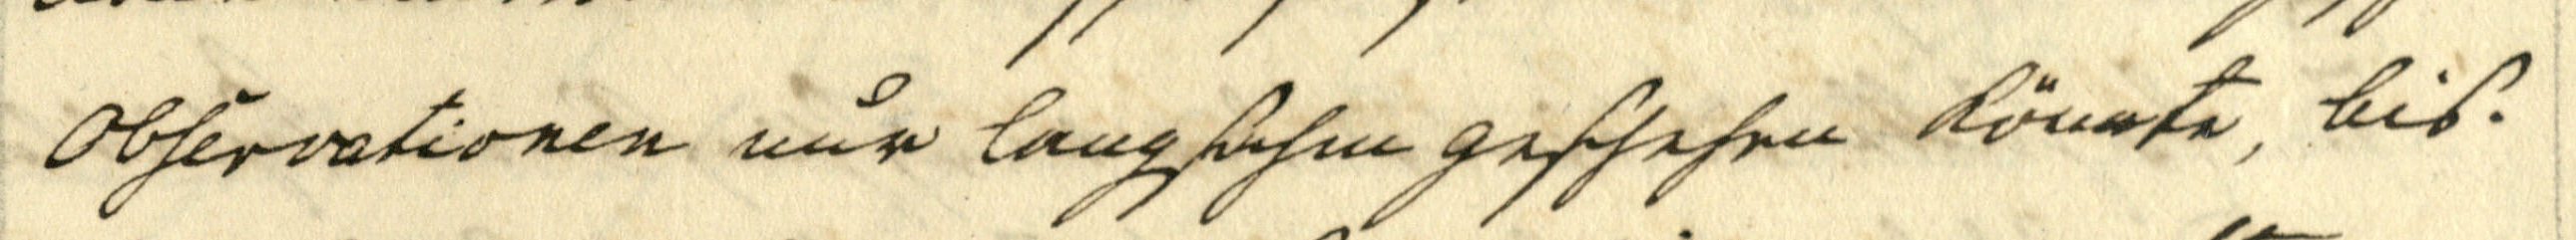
Observationen nur langsahm geschehen könnte, bis¬
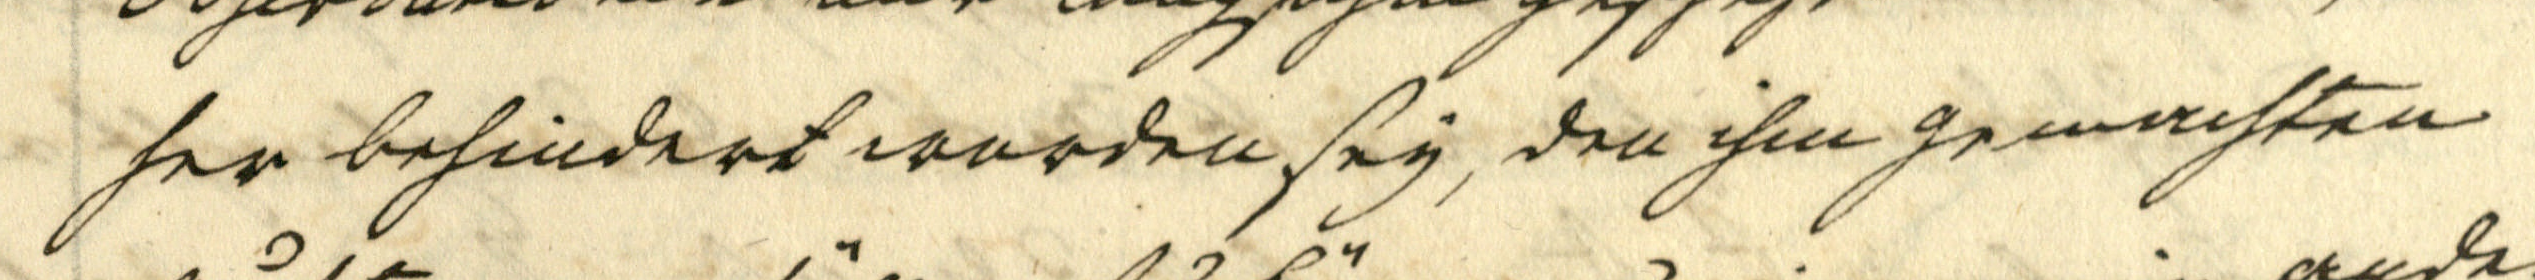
her behindert worden seÿ, den ihm gemachten
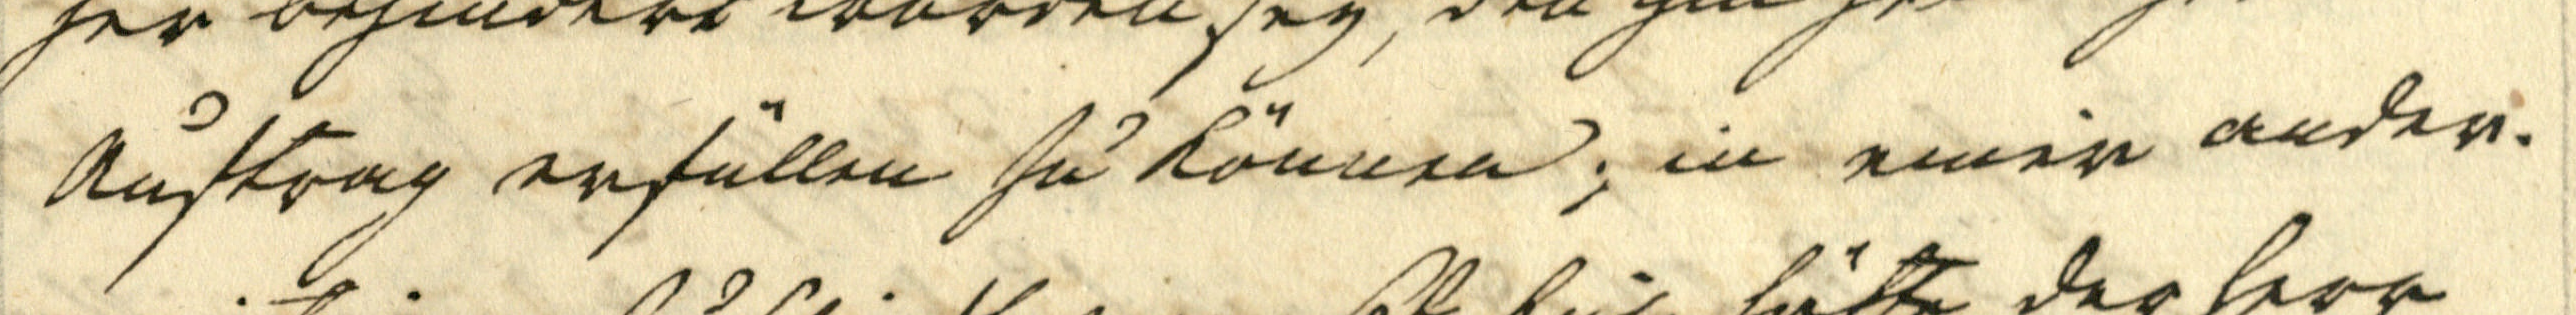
Auftrag erfüllen zu können; in einer ander¬
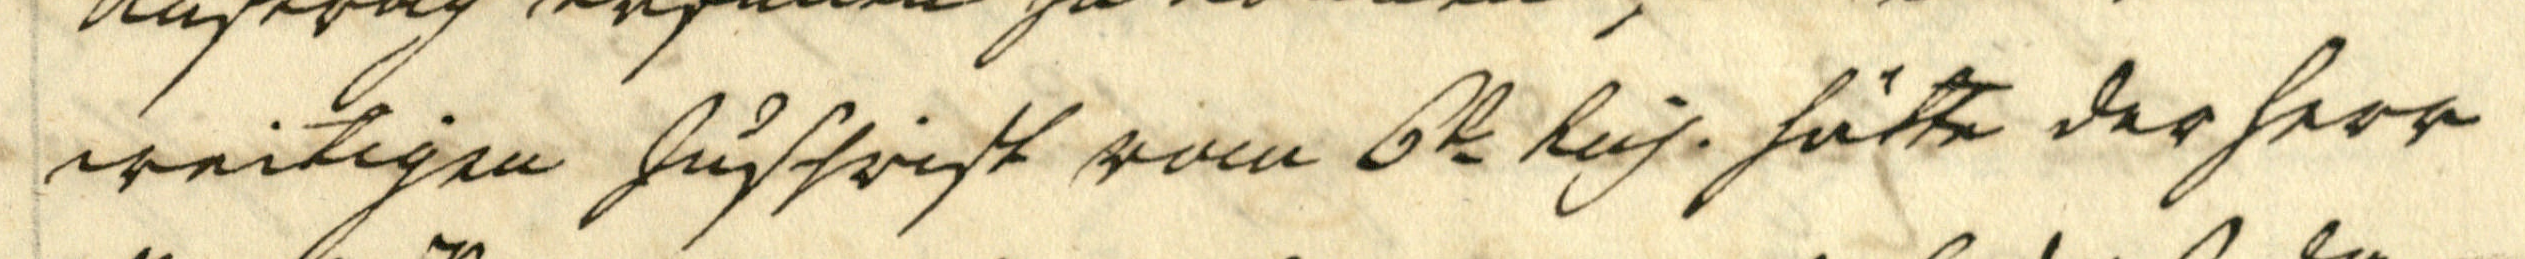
weitigen Zuschrift vom 6 huj. hätte der Herr
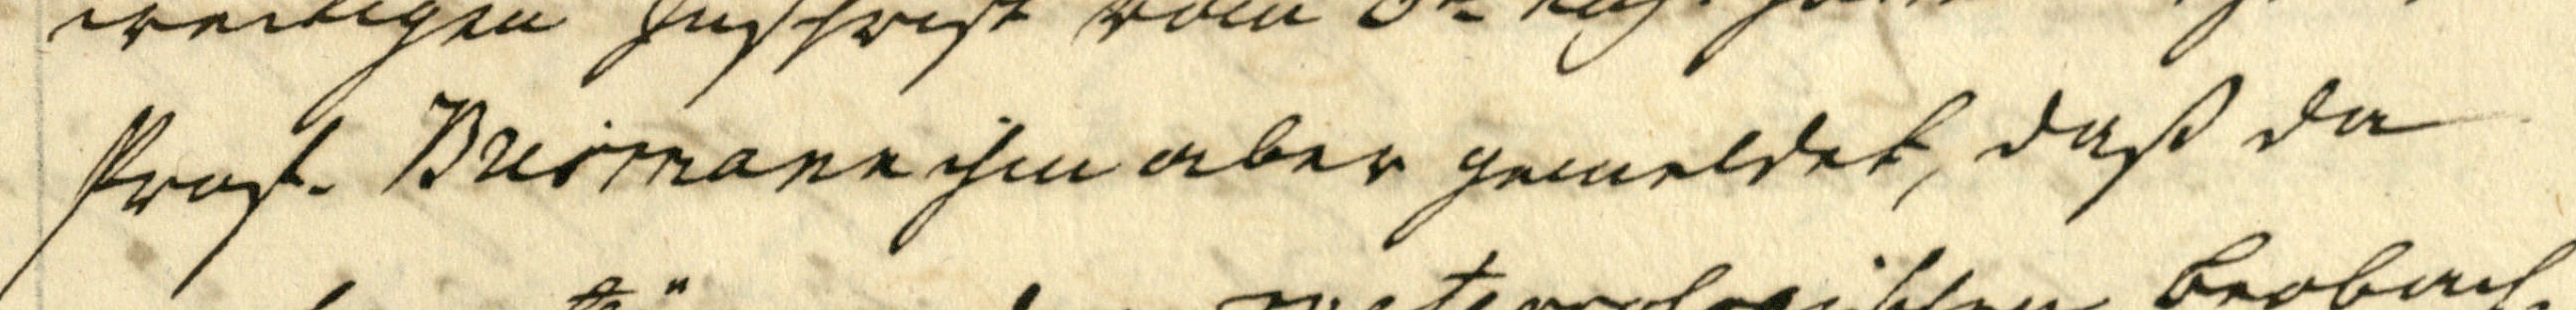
Prof. Brismann ihm aber gemeldet, daß da
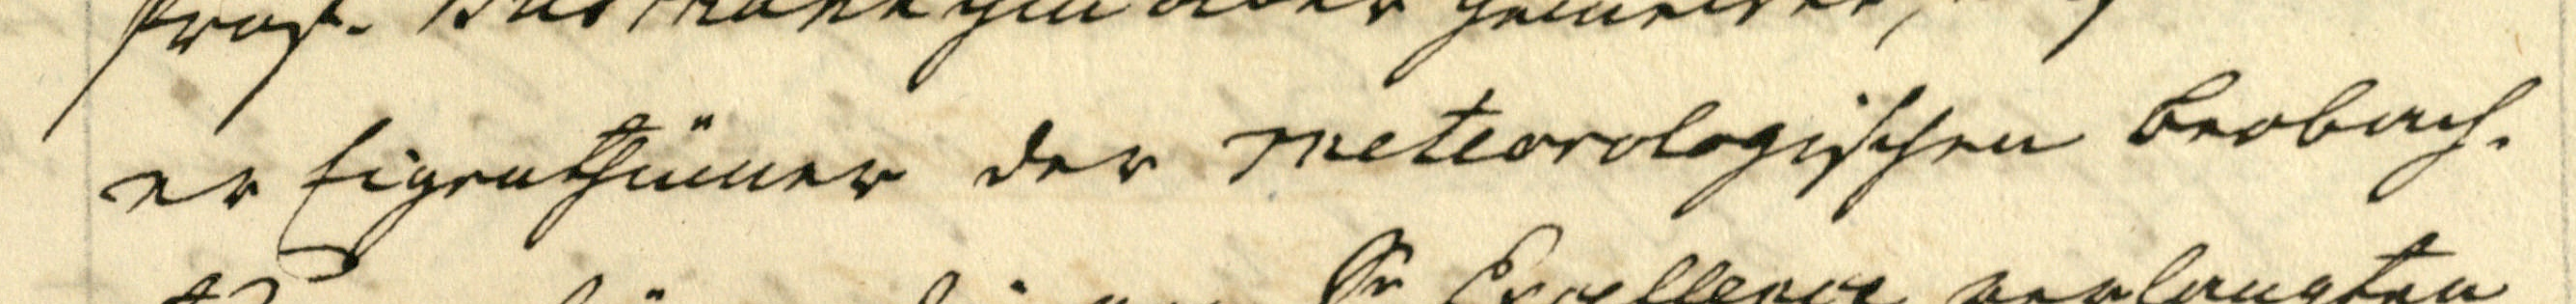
er Eigenthümer der meteorologischen Beobach¬
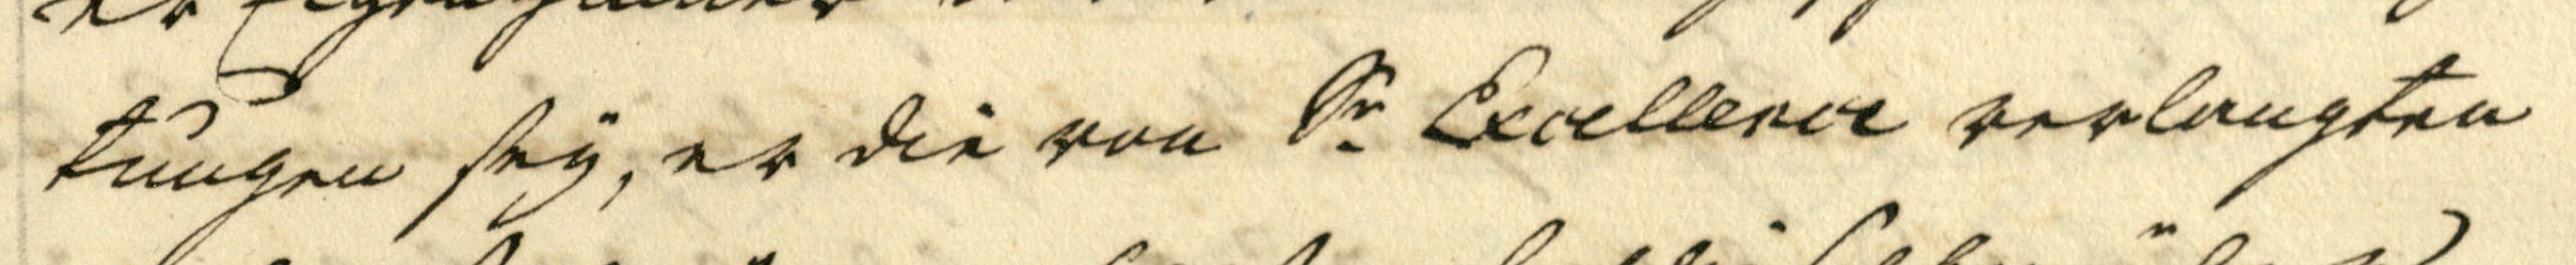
tungen seÿ, er die von Sr Excellence verlangten
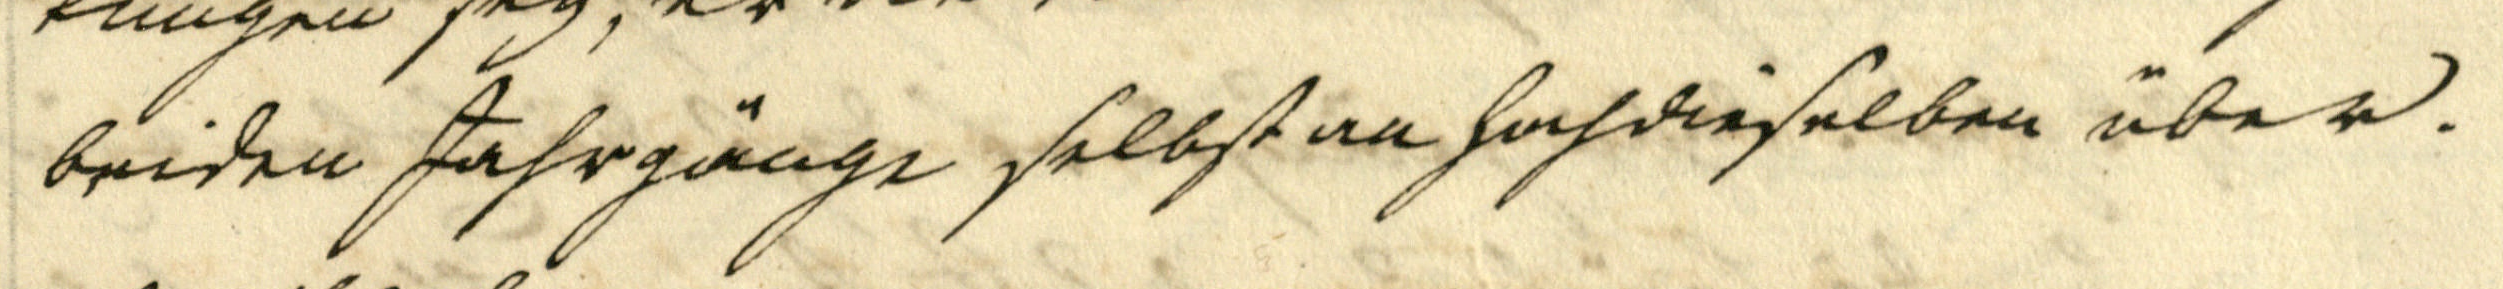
beiden Jahrgänge selbst an Hochdieselben über-
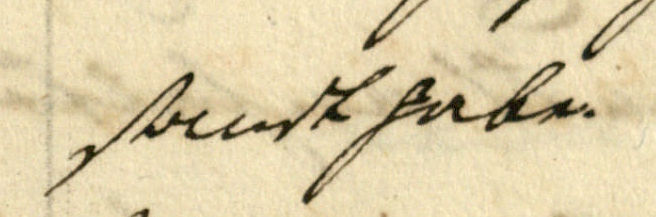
sandt habe.
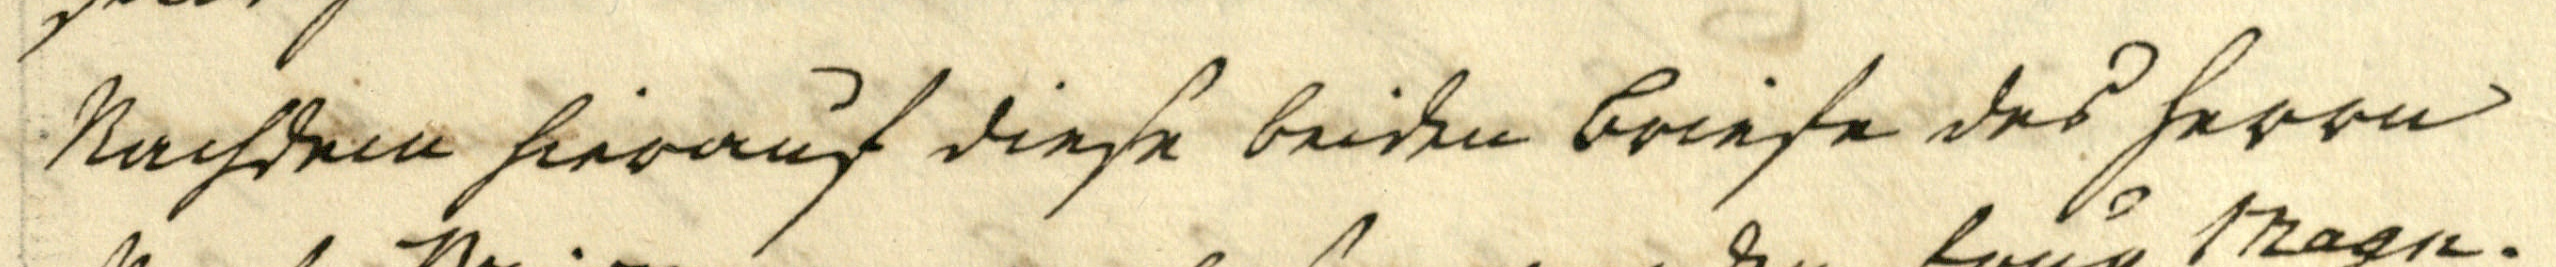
Nachdem hierauf diese beiden Briefe des Herrn
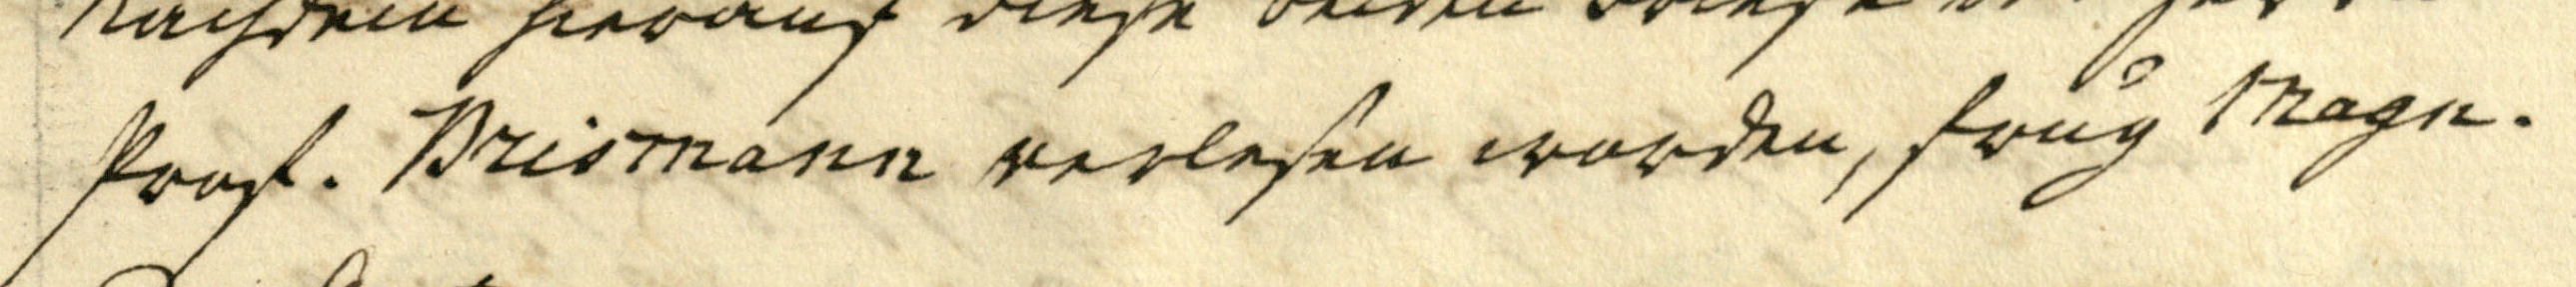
Prof. Brismann verlesen worden, frug Magn.
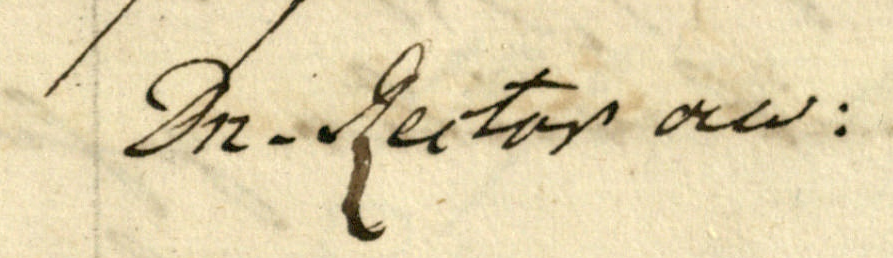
Dn. Rector an:
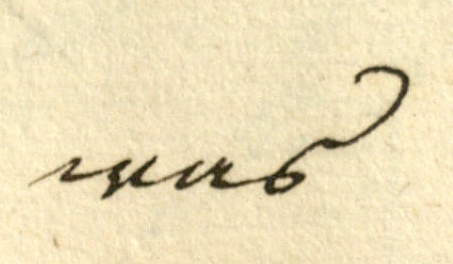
was
